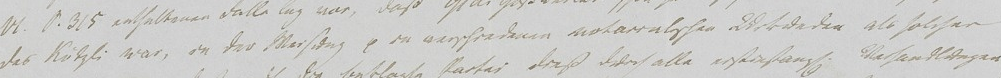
des Kötzli war, in der Weisung & in verschiedenen notarialischen Urkunden als solcher
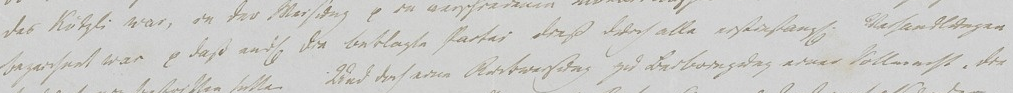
bezeichnet war & daß endlich die beklagte Partei dieß durch alle erstinstanzlichen Verhandlungen
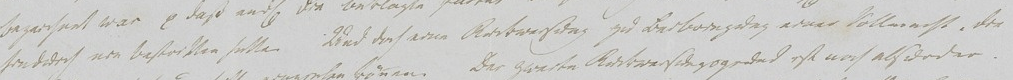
hindurch nie bestritten hatte. Und doch eine Rückweisung zu Beibringung einer Vollmacht, die
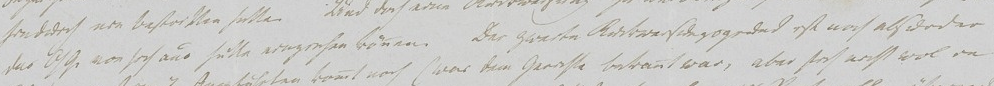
das O.G. von sich aus hätte einziehen können. Der zweite Rückweisungsgrund ist noch absurder.
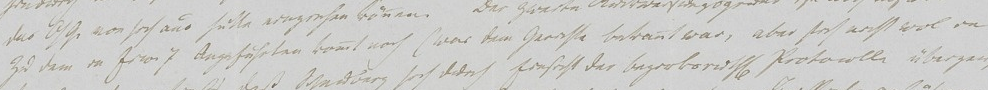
Zu dem in Erw. 7 Angeführten kommt noch (was dem Gerichte bekannt war, aber sich nicht wol in
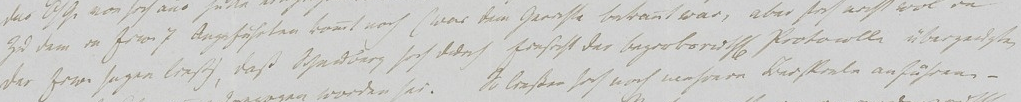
der Erw. sagen ließ), daß Schauberg sich durch Einsicht der bezirksräthlichen Protocolle überzeugte,
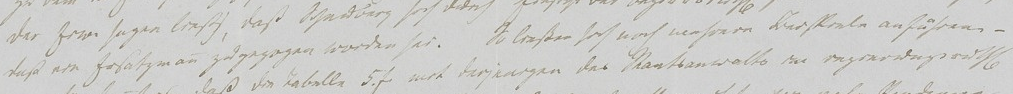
daß ein Ersatzmann zugezogen worden sei. So ließen sich noch mehrere Beispiele anführen –
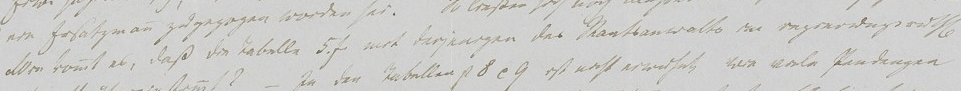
Wie kommt es, daß die Tabelle 5.f. mit derjenigen des Staatsanwalts im regierungsräthlichen
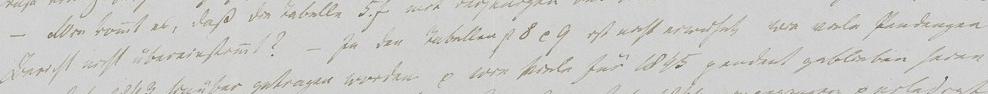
Bericht nicht übereinstimmt? – In den Tabellen p 8 & 9 ist nicht erwähnt, wie viele Pendenzen
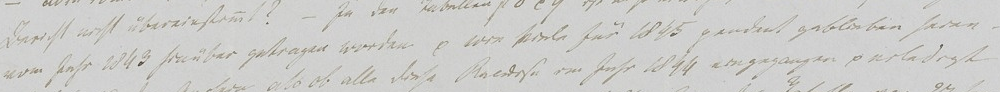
vom Jahr 1843 hinüber getragen wurden & wie viele für 1845 pendent geblieben seien.
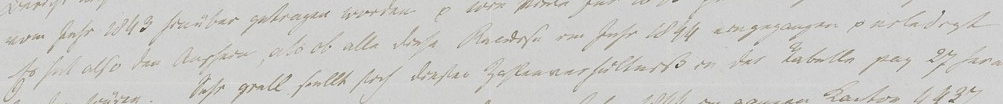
Es hat also den Anschein, als ob alle diese Recurse im Jahr 1844 eingegangen & erledigt
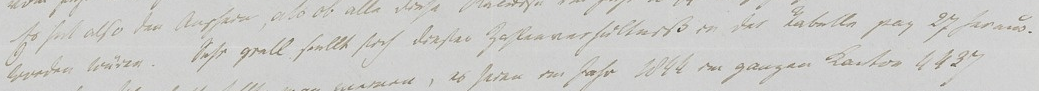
worden wären. Sehr grell stellt sich dieses Zahlenverhältniß in der Tabelle pag 27 heraus.
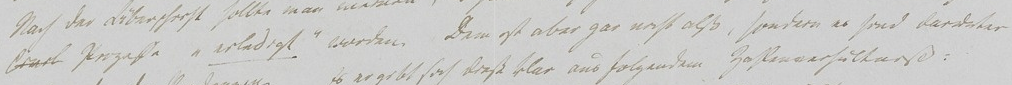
Civil Prozesse «erledigt» worden. Dem ist aber gar nicht also, sondern es sind darunter
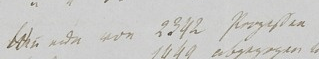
Wenn nun von 2342 Prozessen
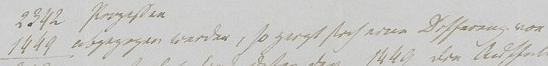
1449 abgezogen werden, so zeigt sich eine Differenz von
